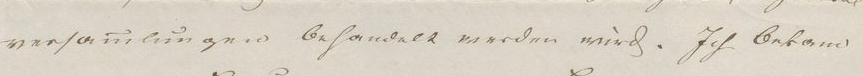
versammlungen behandelt werden wird. Ich bekam
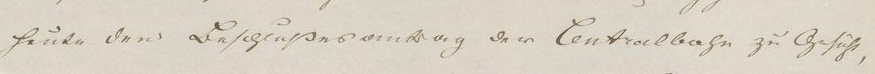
heute den Beschlußesantrag der Centralbahn zu Gesicht,
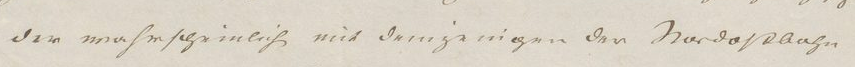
der wahrscheinlich mit denjenigen der Nordostbahn
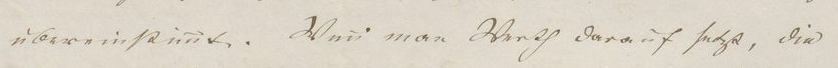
übereinstimmt. Wenn man Werth darauf setzt, die
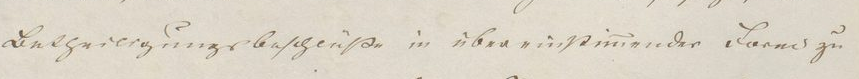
Betheiligungsbeschlüße in übereinstimmender Form zu
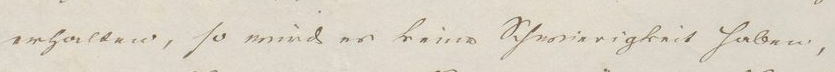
erhalten, so wird es keine Schwierigkeit haben,
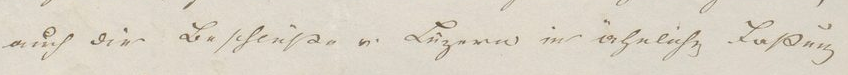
auch die Beschlüße v. Luzern in ähnliche Faßung
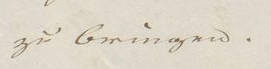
zu bringen.
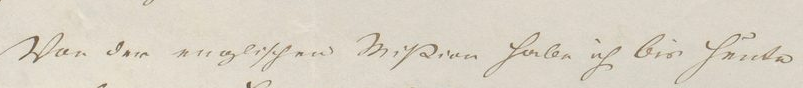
Von der ungleichen Mißion habe ich bis heute
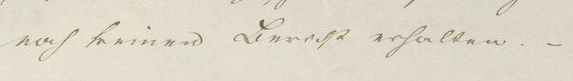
noch keinen Bericht erhalten. –
